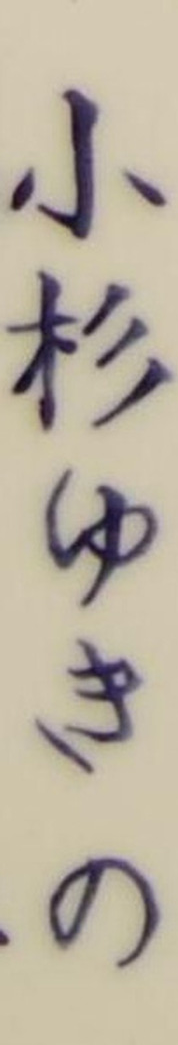小杉ゆきの
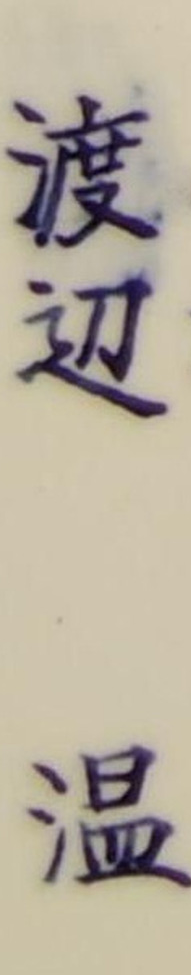渡辺温
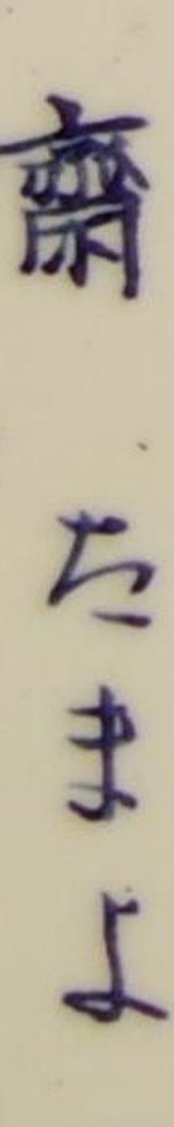齋たまよ
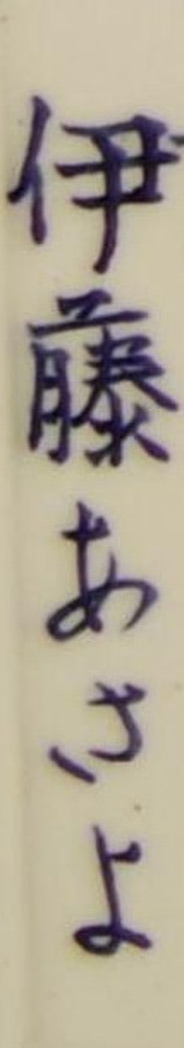伊藤あさよ

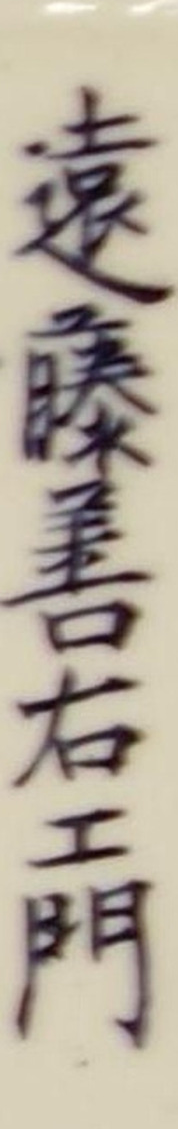遠藤善右エ門
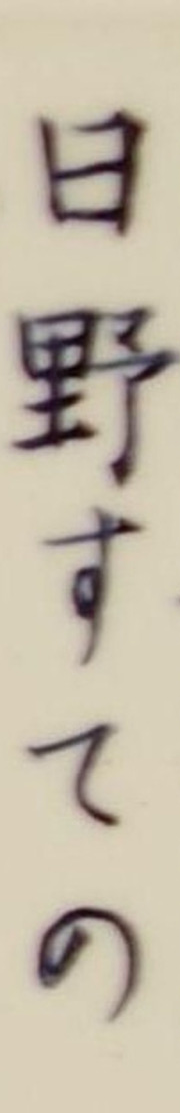日野すての
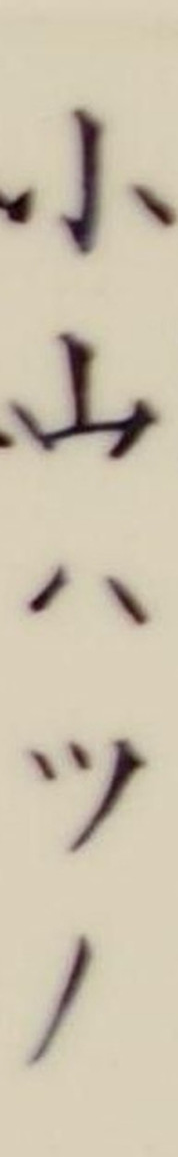小山ハツノ
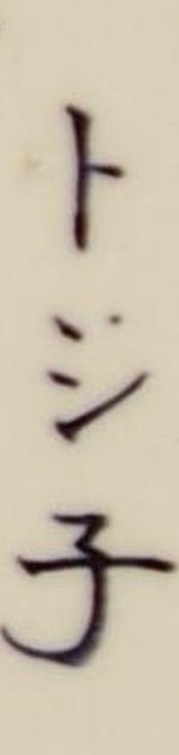トシ子
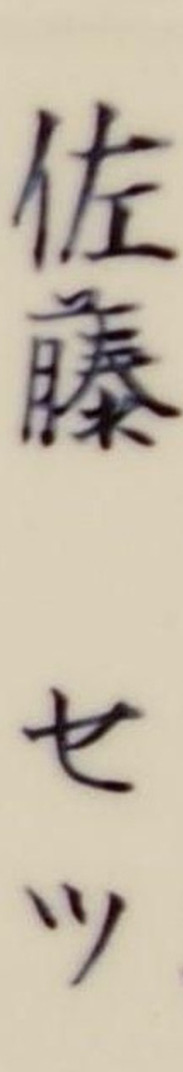佐藤セツ
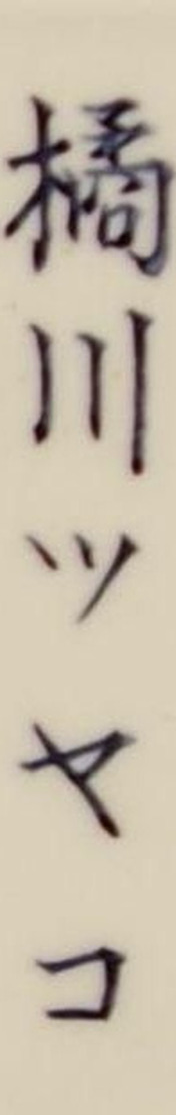橋川ツヤコ
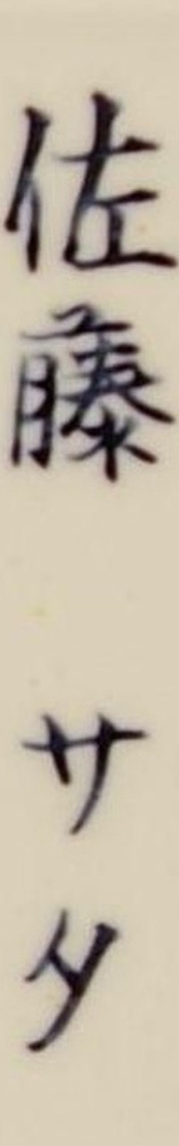佐藤サタ
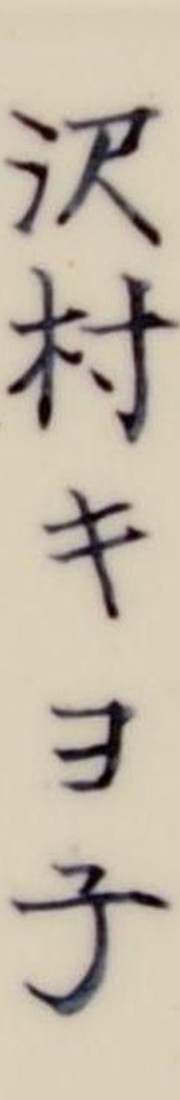沢村キヨ子
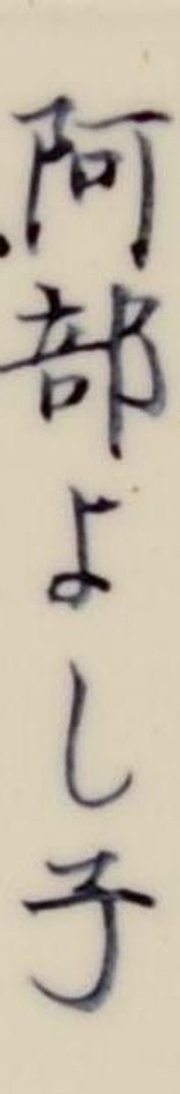阿部よし子
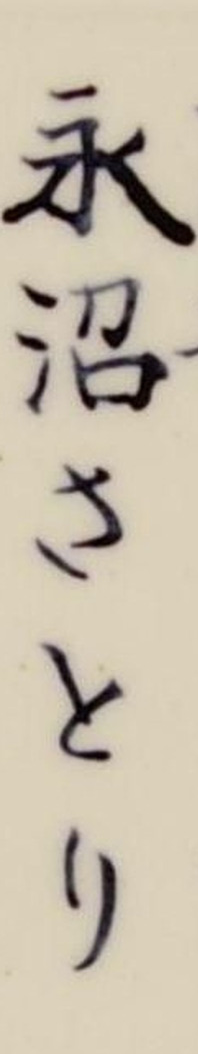永沼さとり
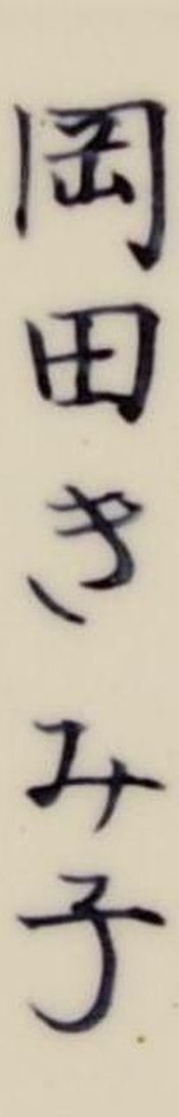岡田きみ子
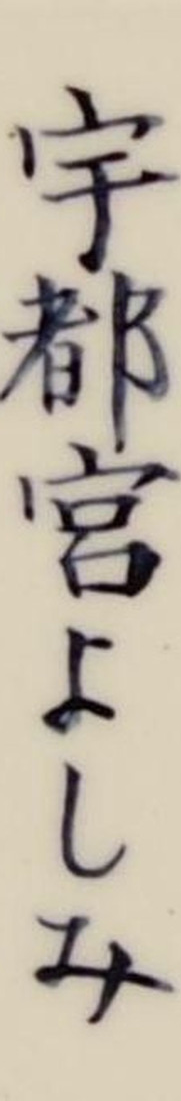宇都宮よしみ
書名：A~D
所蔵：koyasan kongobuji
